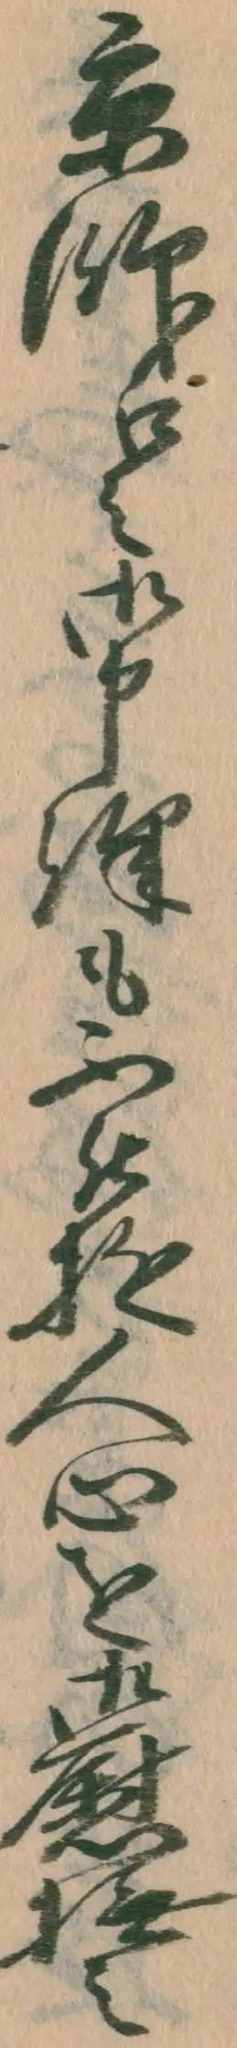京師えは御申譯も不被遊人心を御慰撫之
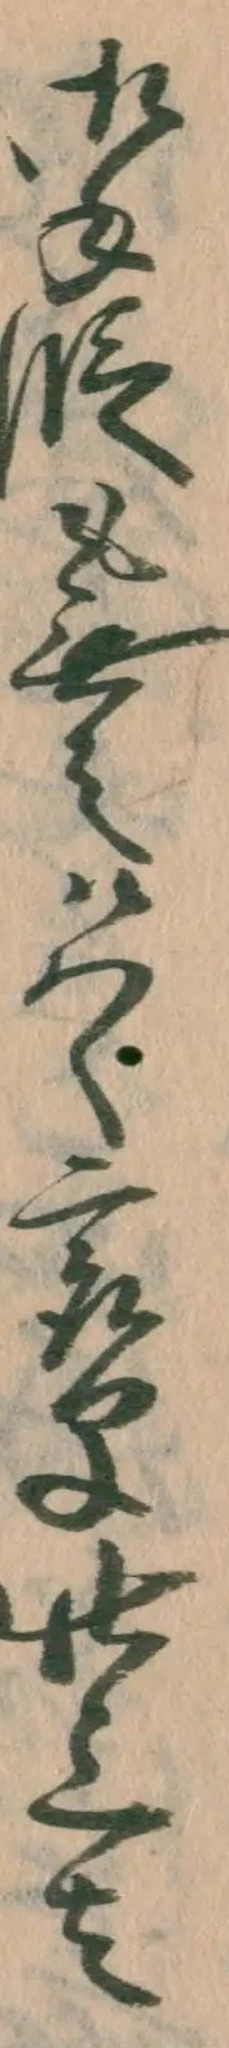御手段も無之候ハゝ最早此上者
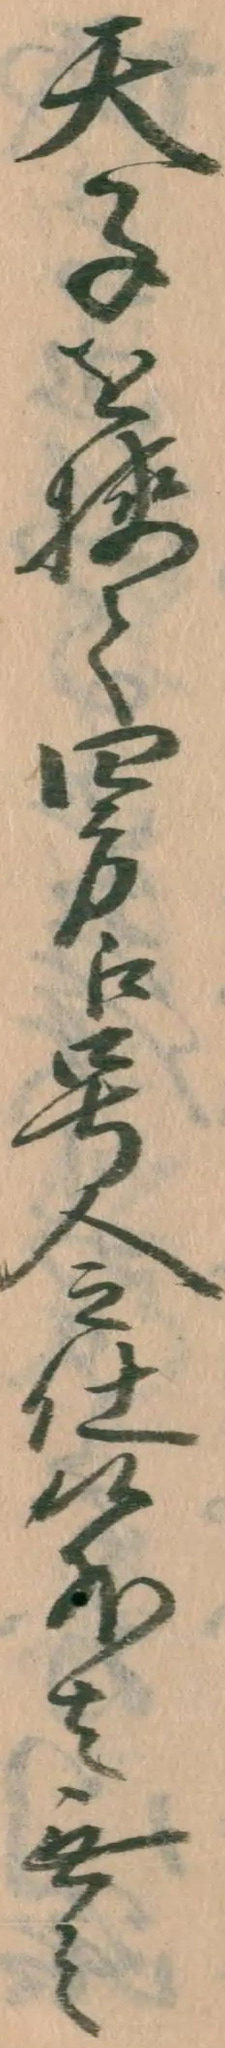天子を挟て四方え号令仕候外者無之
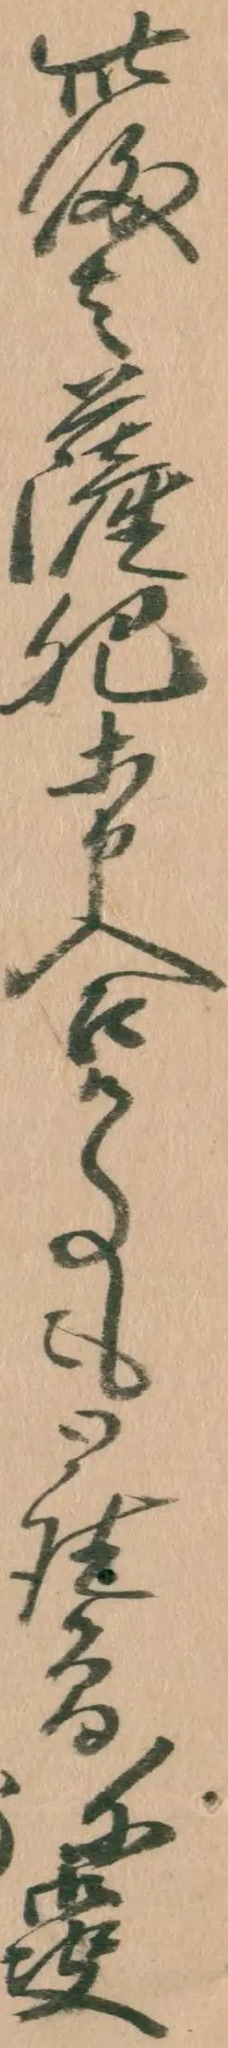此儀者薩肥等申合候事も御座候間弥御決
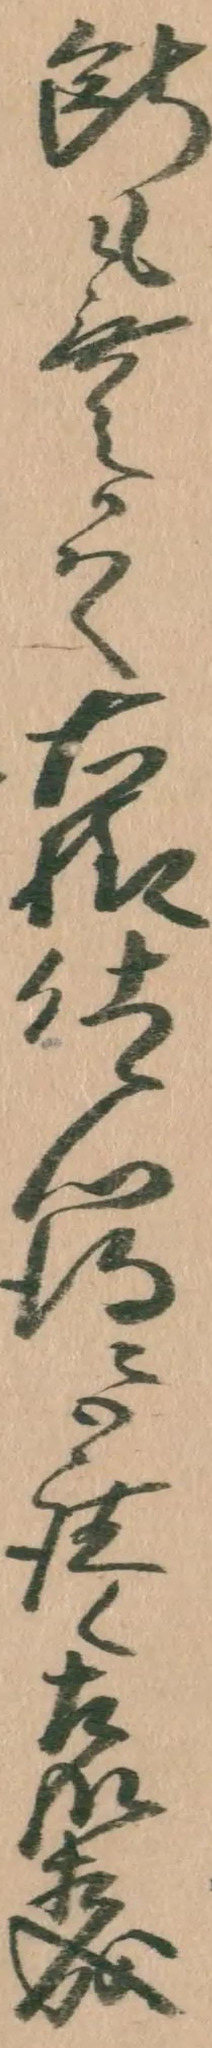断も無之候ハゝ右様仕候心得ニ御座候左様相成
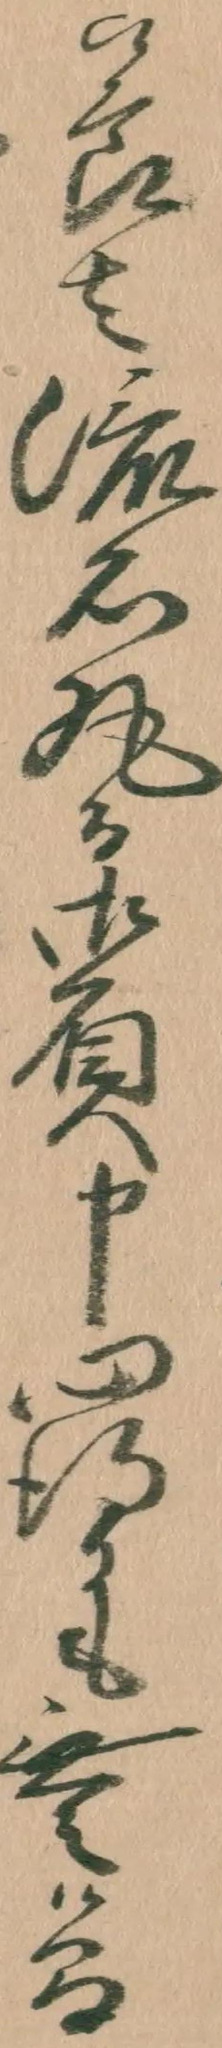候節者流石丸而御負申心得にも無之候間
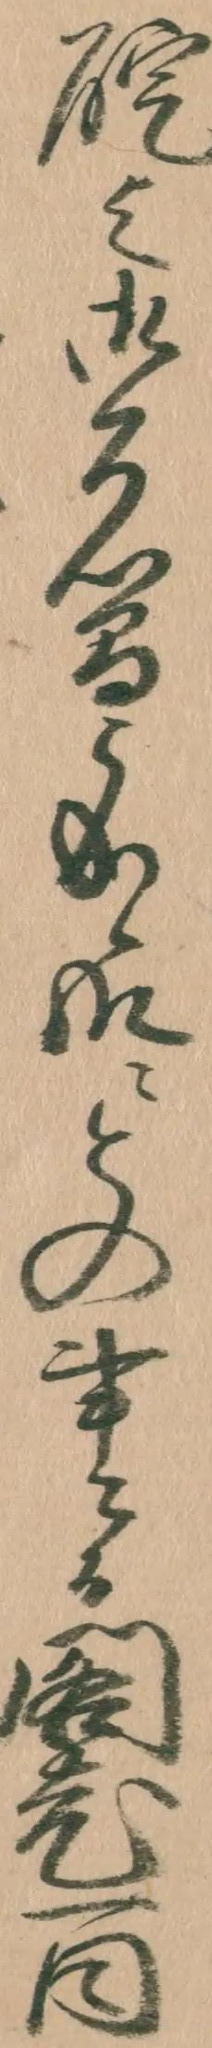聢と御了簡被成候様ニとの事ニ而閣老一同
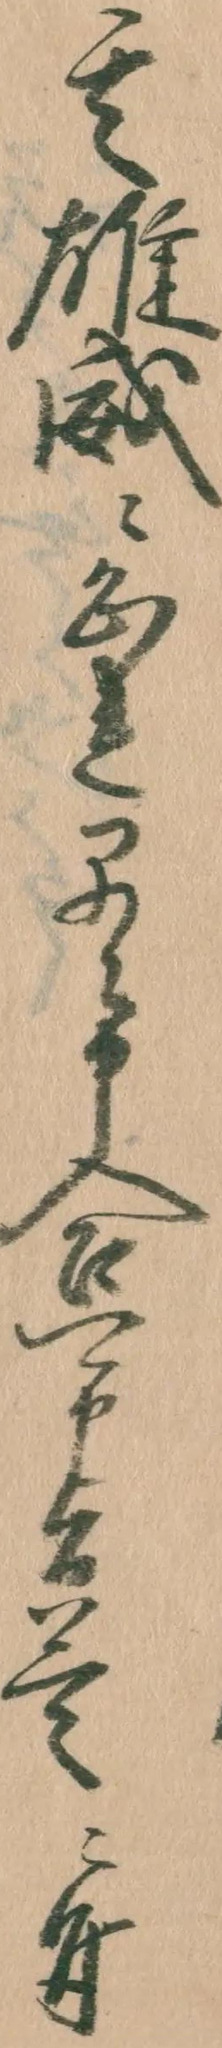其雄威ニ恐れ早々申合可申旨答二付
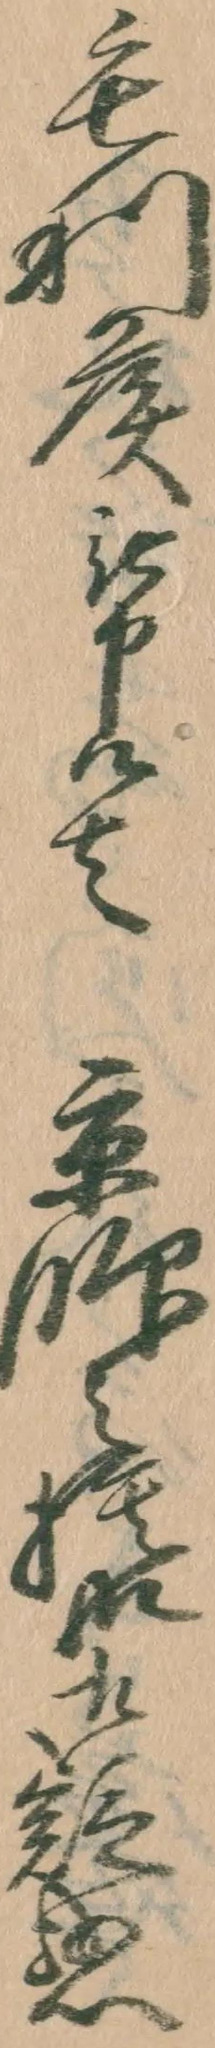毛利侯被申候者京師之模様御疑惑
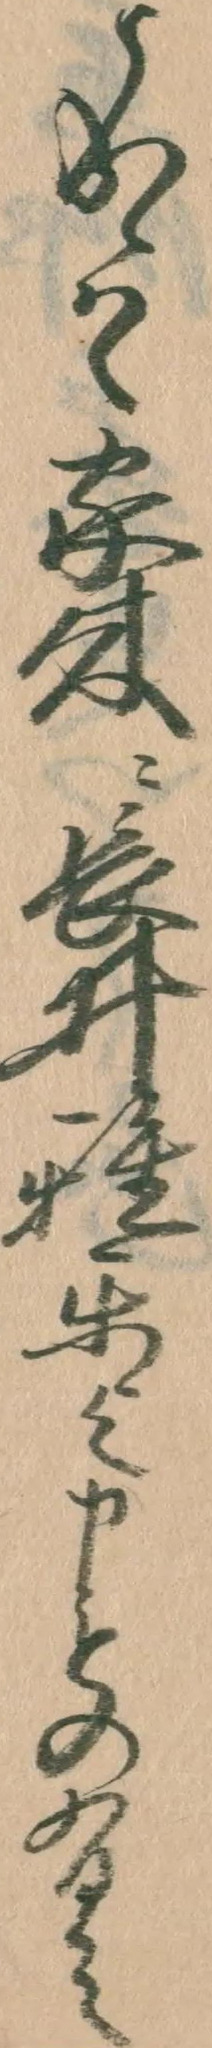被成候ハゝ家来ニ長井雅楽と申もの有之
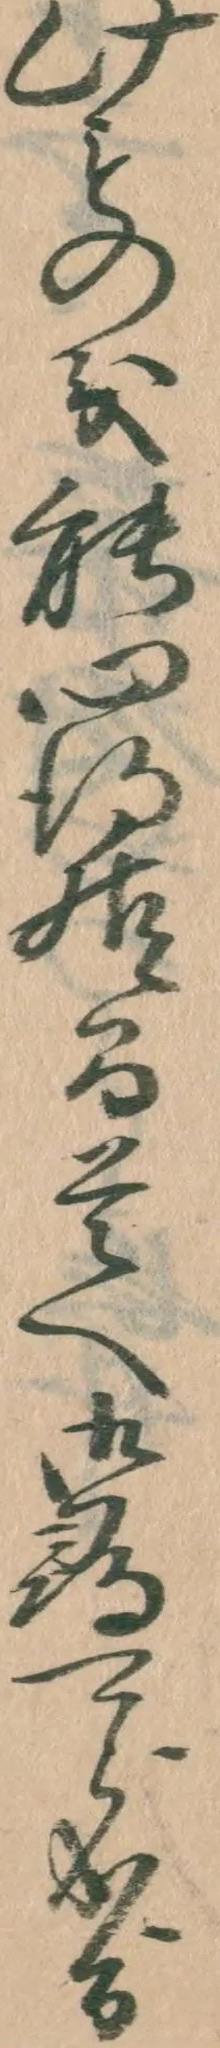此もの義能心得居候間是へ御尋可被成旨
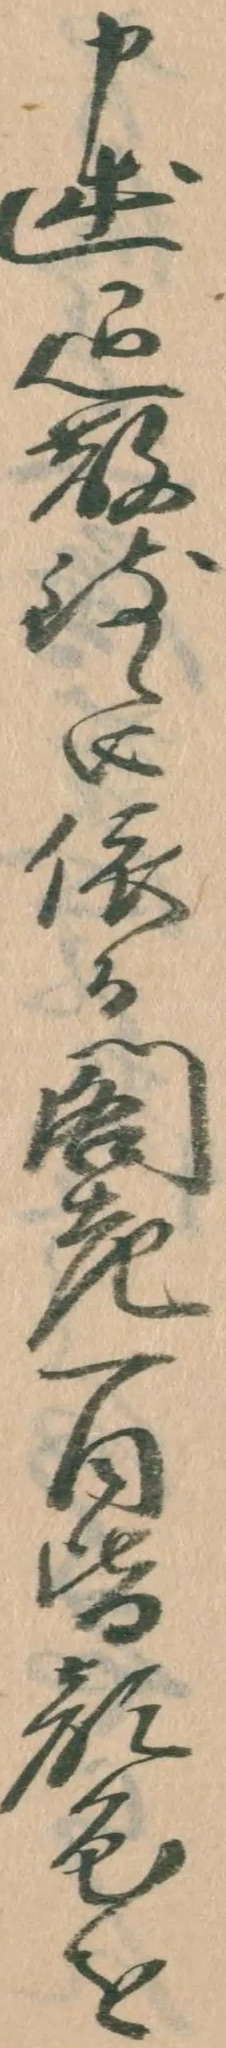申述退散致候由依而閣老一同皆顔色を
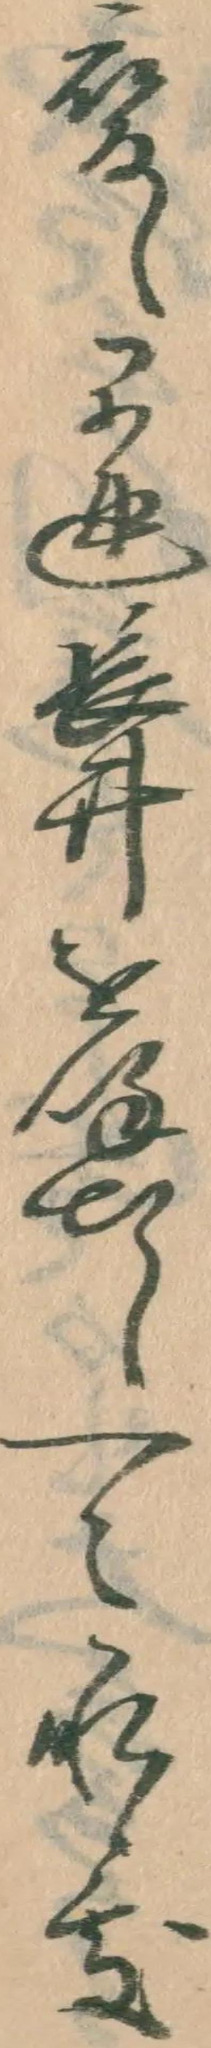変し早速長井を呼出し一々承候処

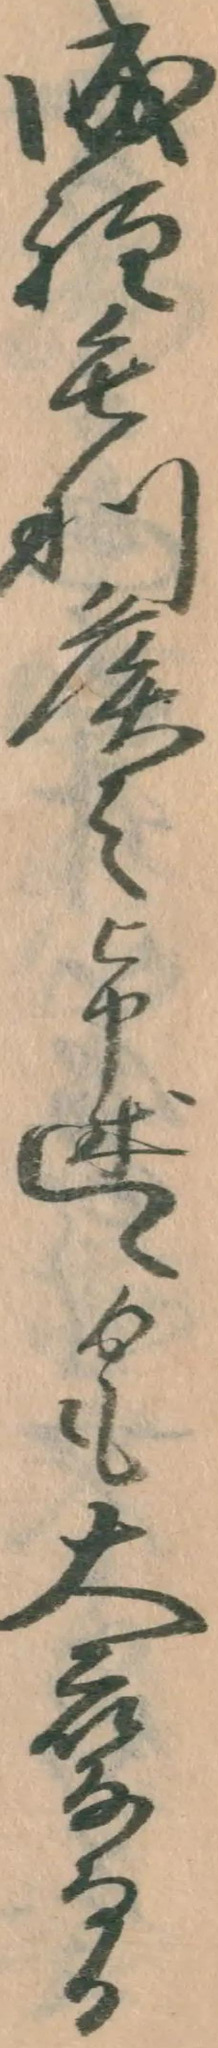成程毛利侯之被申述候よりも大変なる
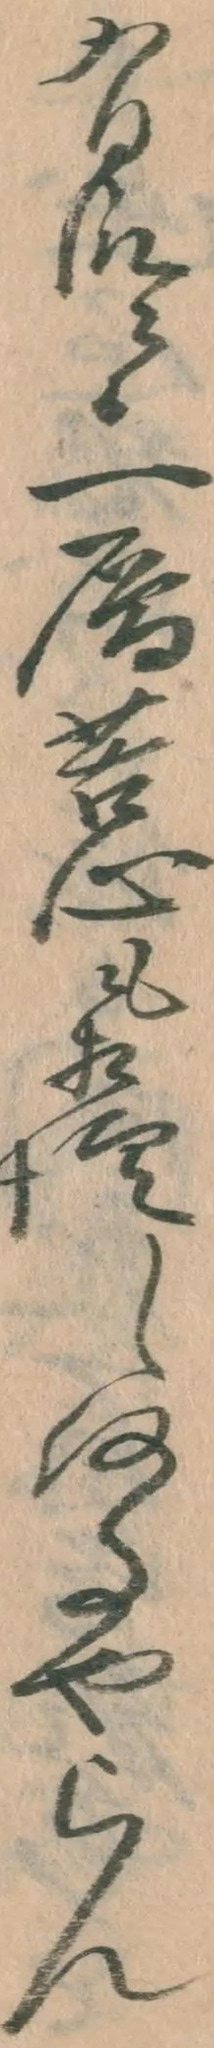有様ニ而一層苦心も相増し何事やらん
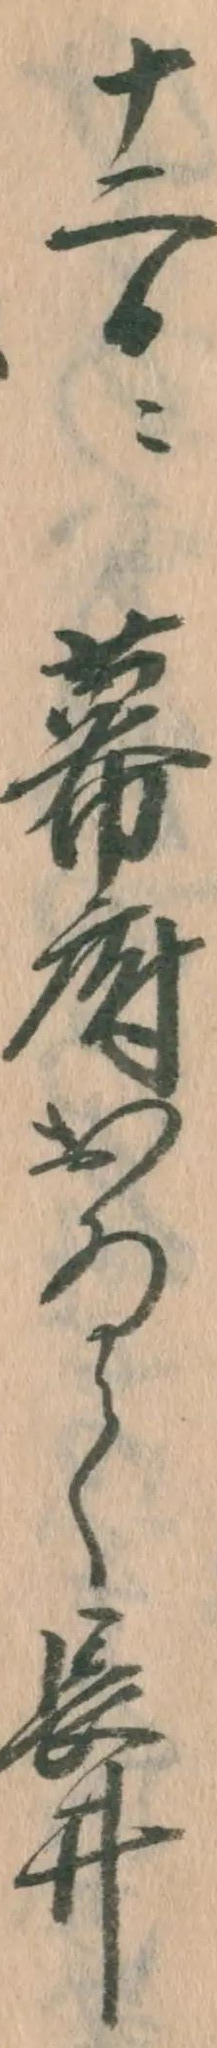十二日ニ幕府おゐて長井
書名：麗斎叢書. 20
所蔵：国立国会図書館 National Diet Library, JAPAN
